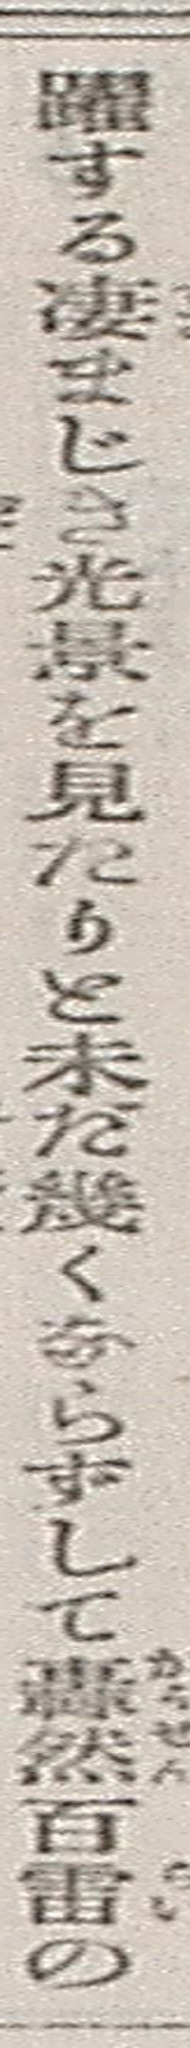躍する凄まじき光景を見たりと未だ幾くならずして轟然百雷の
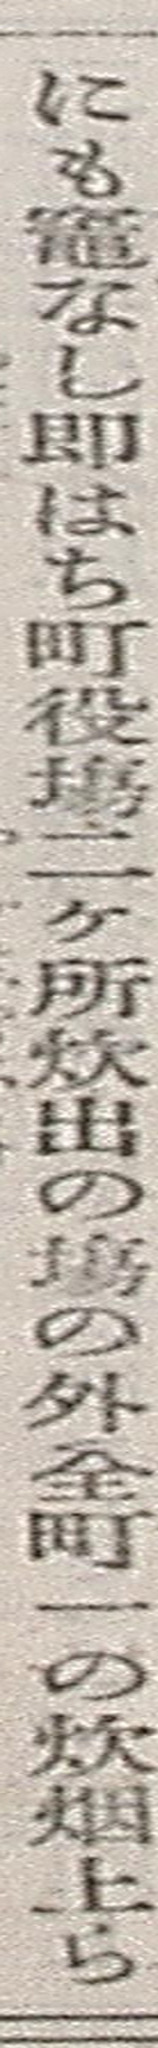にも竈なし即はち町役場二ヶ所炊出の場の外全町一の炊烟上ら
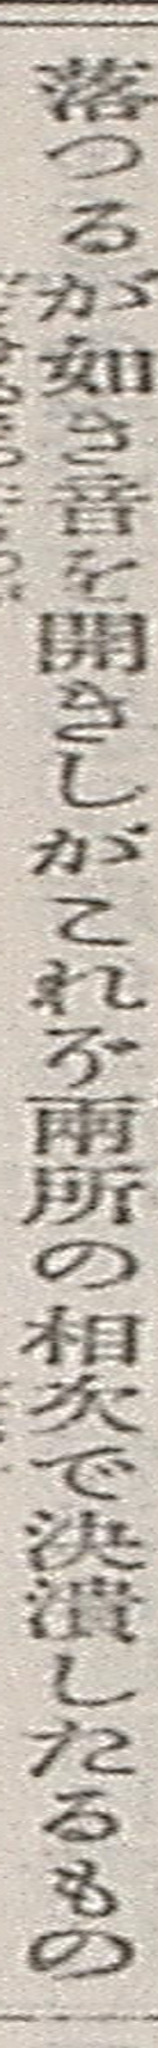落つるが如き音を聞きしがこれぞ両所の相次で决潰したるもの
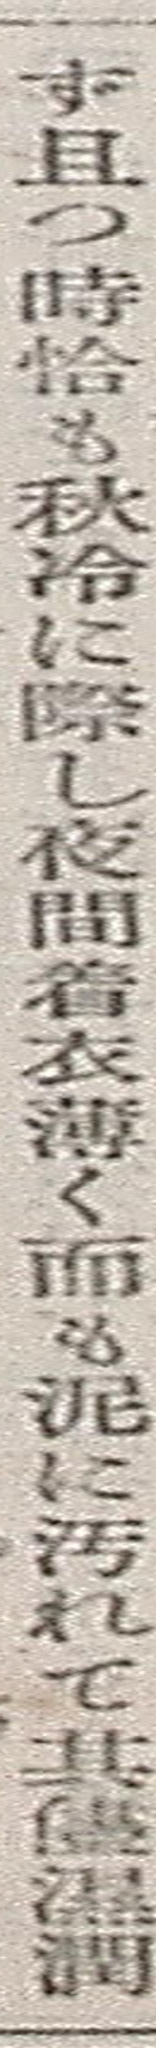ず且つ時恰も秋冷に際し夜間着衣薄く而も泥に汚れて其儘湿潤
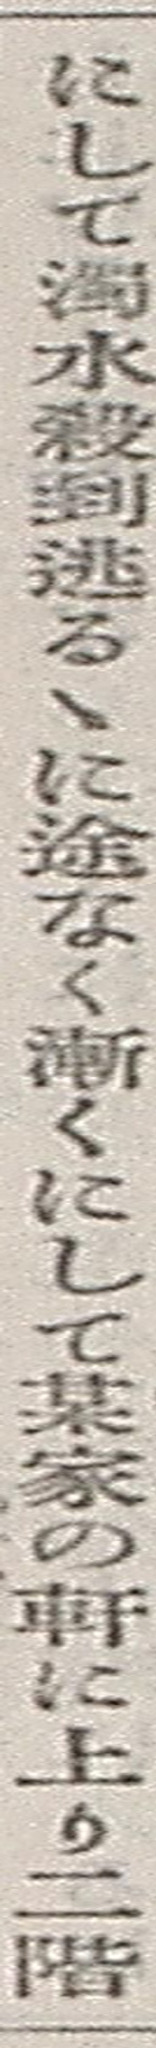にして濁水殺到逃るゝに途なく漸くにして某家の軒に上り二階
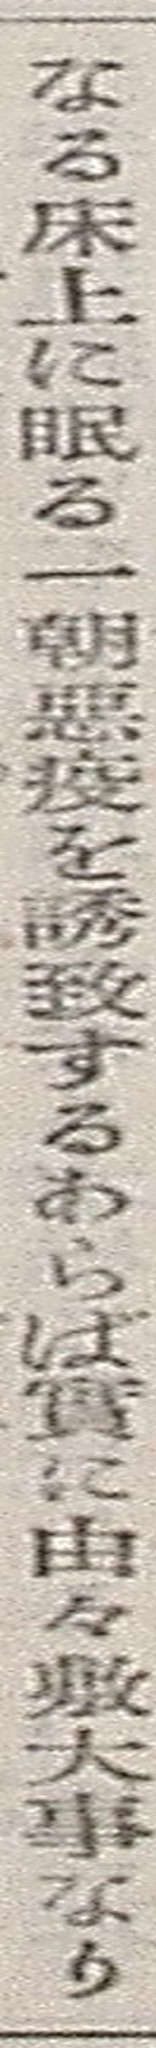なる床上に眠る一朝悪疫を誘発するあらば実に由々敷大事なり
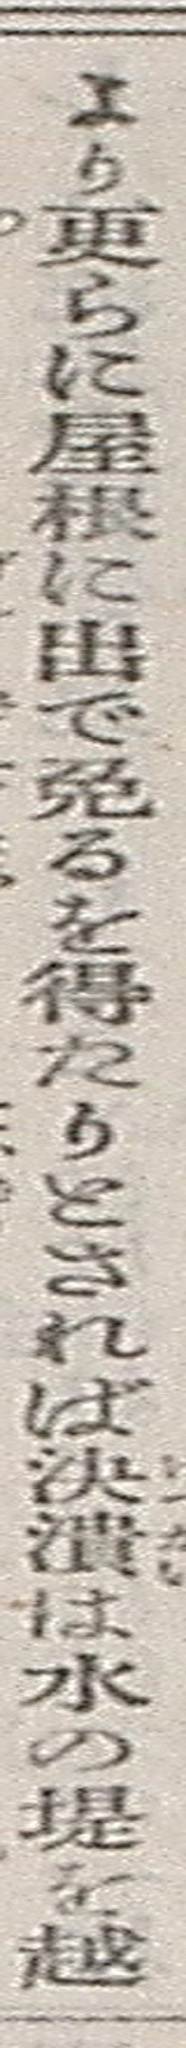より更らに屋根に出で免ろを得たりとされば决潰は水の堤を越
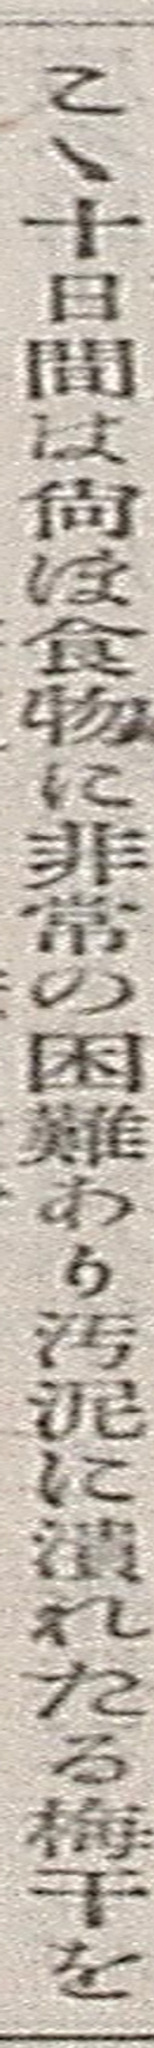こゝ十日間は尚ほ食物に非情の困難あり汚泥に潰れたる梅干を
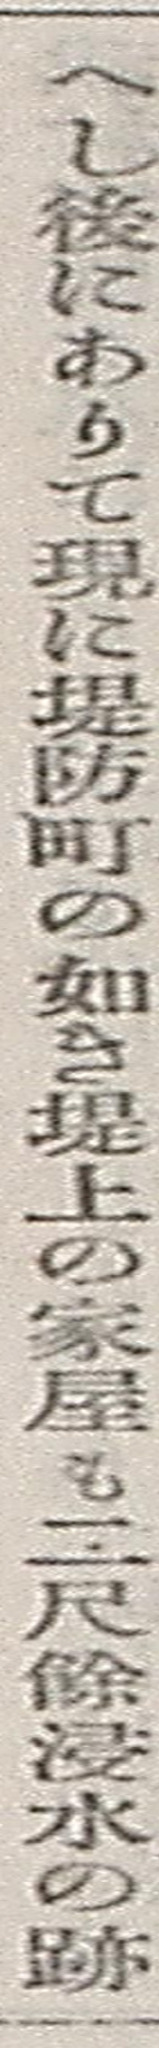へし後にありて現に堤防町の如き堤上の家屋も二尺餘浸水の跡
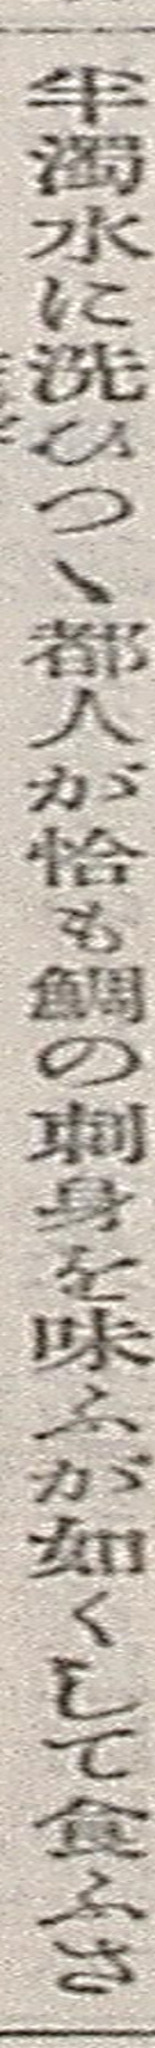半濁水に洗ひつゝ都人が恰も鯛の刺身を味ふが如くして食ふさ
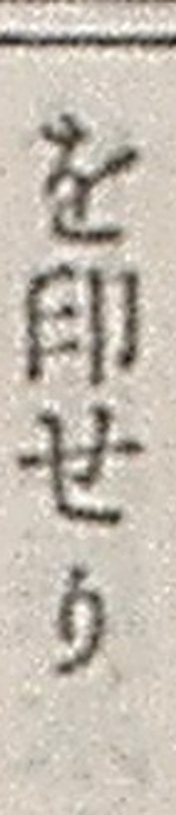を印せり
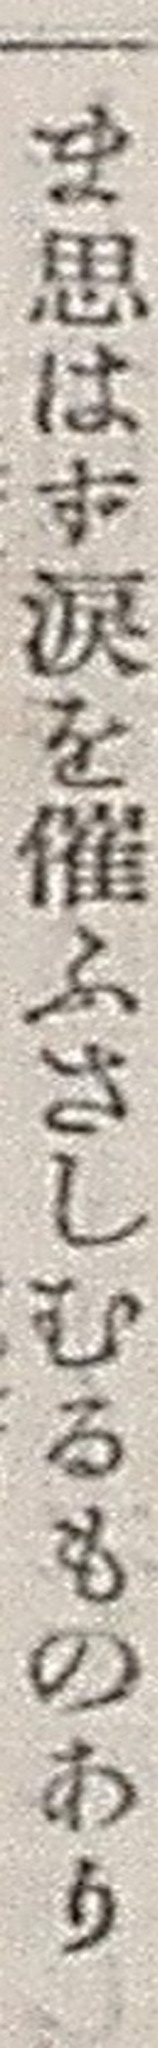ま思はず涙を催ふさしむるものあり
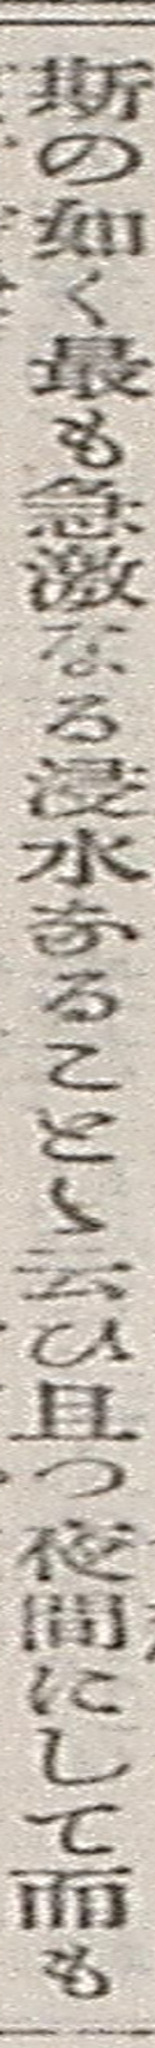斯の如き最も急激なる浸水なることゝ云且つ夜間にして而も
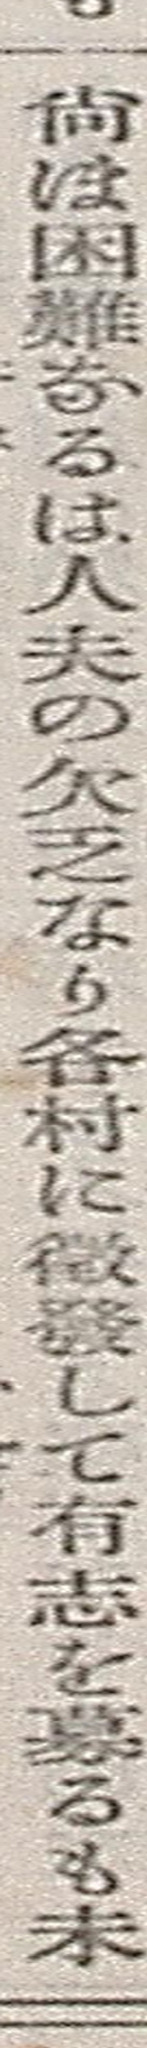尚ほ困難なるは人夫の欠乏なり各村に徴発して有志を募るも未
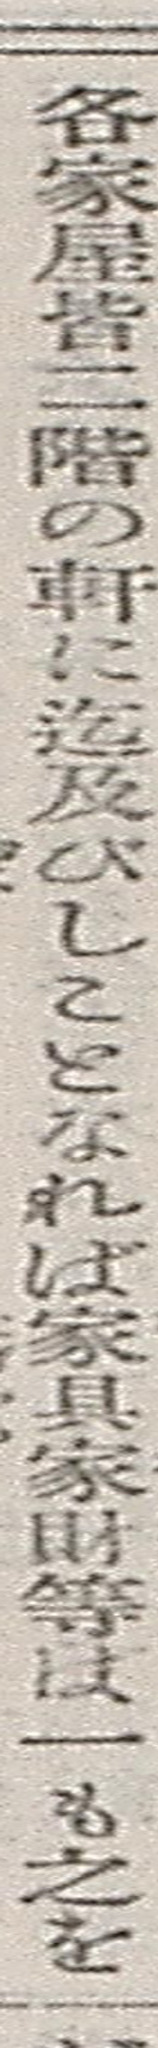各家屋皆二階の軒に迄及びそことなれば家具家財等は一も之を
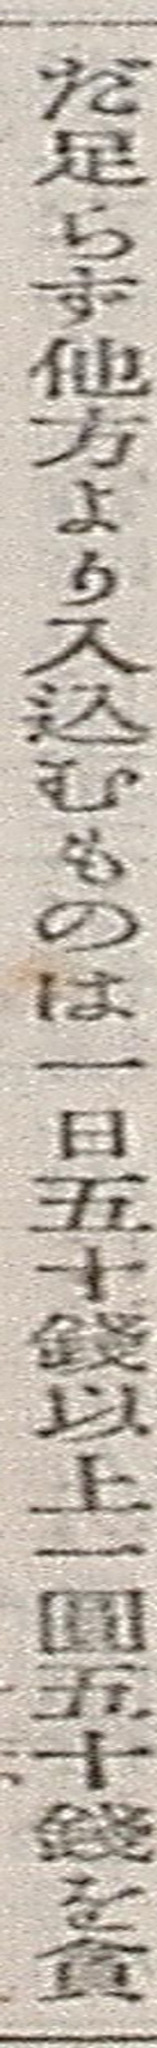だ足らず他方より入込むものは一日五十銭以上一円五十銭を貧
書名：風俗畫報臨時増刊第百二十六號　洪水被害録（中）
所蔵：東京大学地震研究所図書室 Earthquake Research Institute Library, The University of Tokyo, JAPAN
